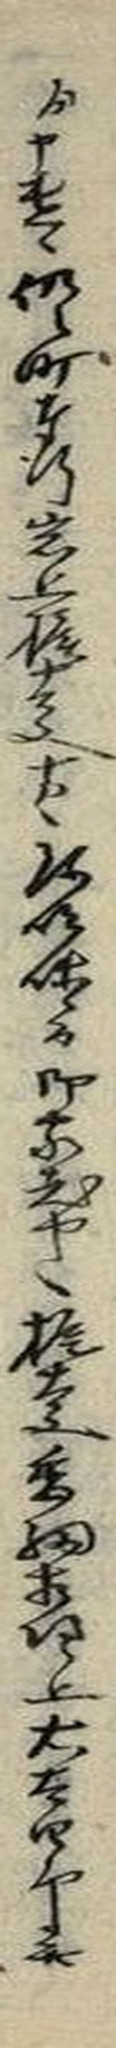ゟ申遣候仍之町奉行岩上梶太夫方へ致吟味候而御家老中へ梶太夫委細相伺候上右太四郎幷
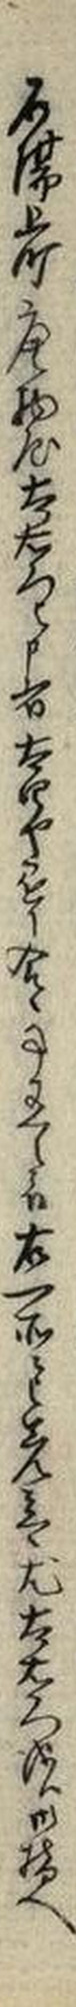石場上町唐物屋太右衛門与申者太四郎懸り合候事有之候ニ付右一所ニ被差立候尤太右衛門儀ハ御指人
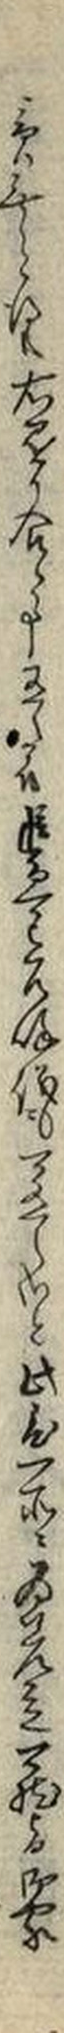ニ而ハ無之候得共右懸り合候事有之ニ付追而可被召呼儀も可有之哉と此度一所ニ為差立可然旨御家
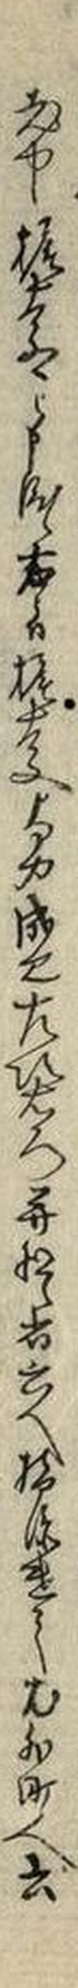老中梶太夫へ被申渡候右ニ付梶太夫与力成見左次右衛門幷組之者六人指添遣之尤外町人六
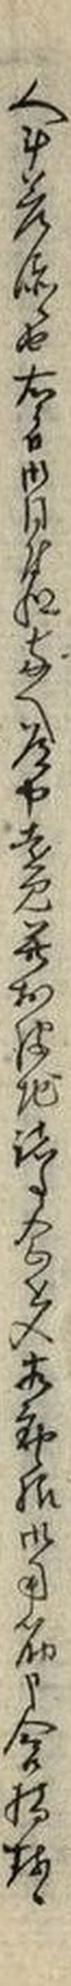人斗差添候由右ニ付御目付組両人道中遠見幷於彼地諸事念を入相勤候様御用筋申含指越候
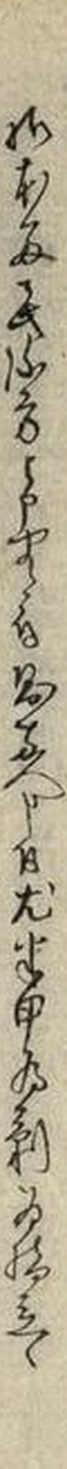様本多民弥方被申聞候ニ付則両人申付尤半甲為剃為指立候
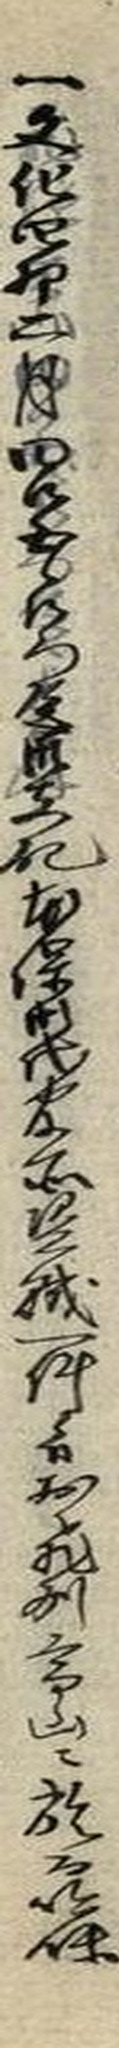一文化四卯二月田口五郎左衛門殿御支配本保御代官所盗賊一件ニ付於飛州高山ニ於而吟味
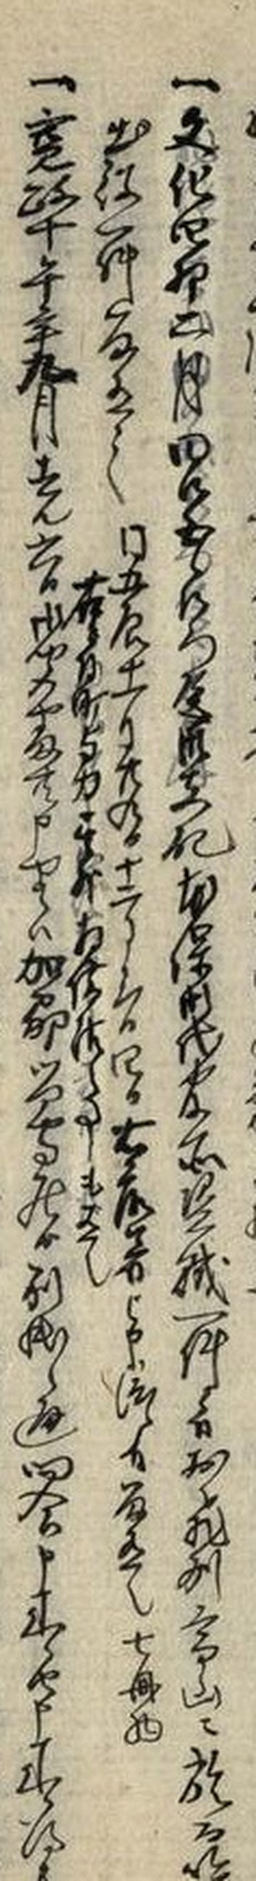出役一件留有之同五辰十一月廿九日十二月三日四日右落着被申渡候ニ付留有之七冊物
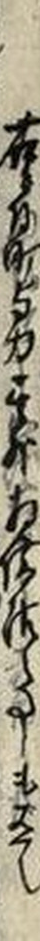右ニ付町与力其外拝借銀之事も有之
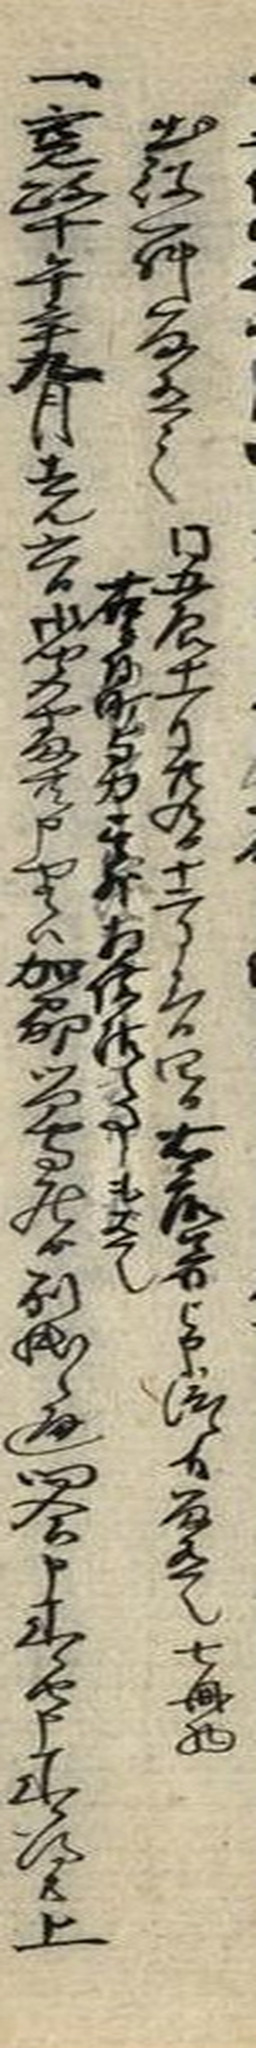一寛政十午年九月去ル六日御聞番共申聞候ハ加州留守居ゟ別紙之通問合申来候由申来候得共上
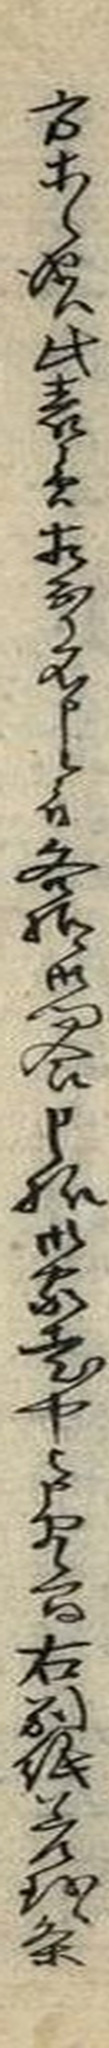方等之儀ハ此表ニ而ハ相分り不申候ニ付各様へ御問合申様御家老中被申聞候間右別紙差越候条
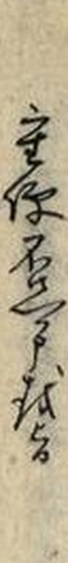重便否可申越旨
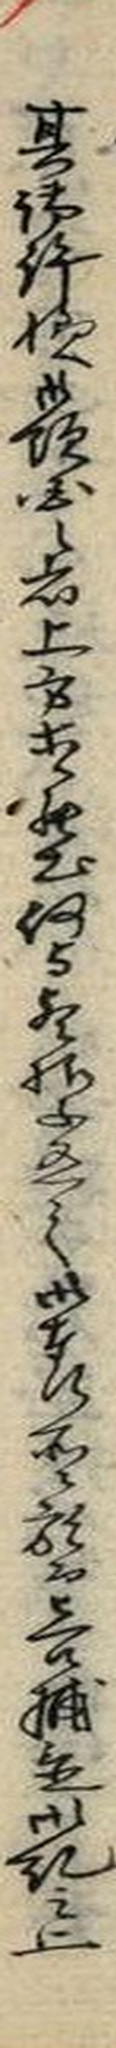其御許様御領国之者上方等へ罷出何与歟様子有之御奉行所ニ於而被召捕置御糺之上

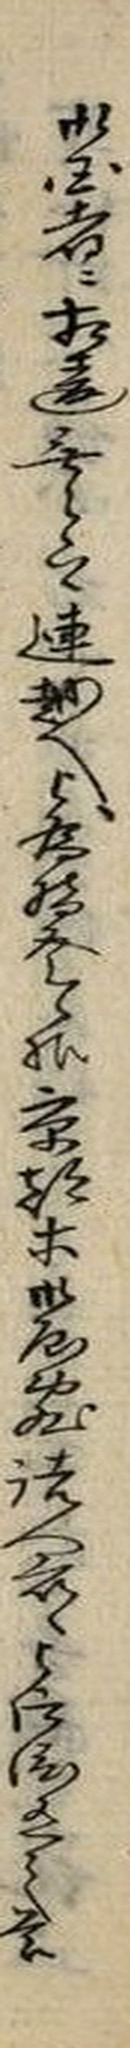御国者ニ相違無之候ハヽ連越人被為指登候様京都等御屋敷諸人衆へ被仰渡有之節
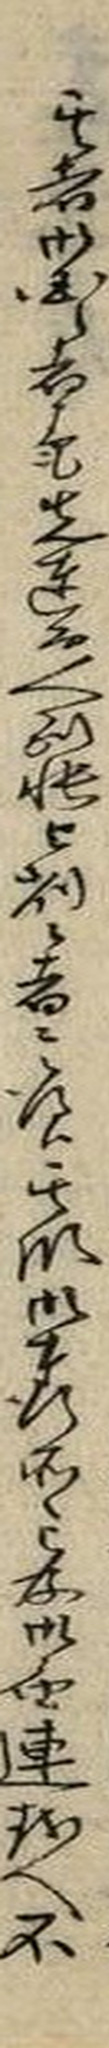其者御国之者ニ而も先達而人別帳被削候者ニ候得ハ其段御奉行所へ被及御届連越人不
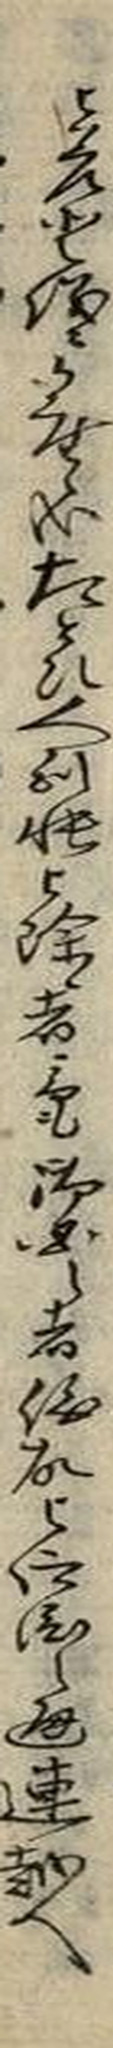被為差登候儀ニ御座候哉たとひ人別帳被除候者ニ而も御国之者儀故被仰渡之通連越人
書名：御国他国諸事之部
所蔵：福井県文書館 Fukui Prefectural Archives
